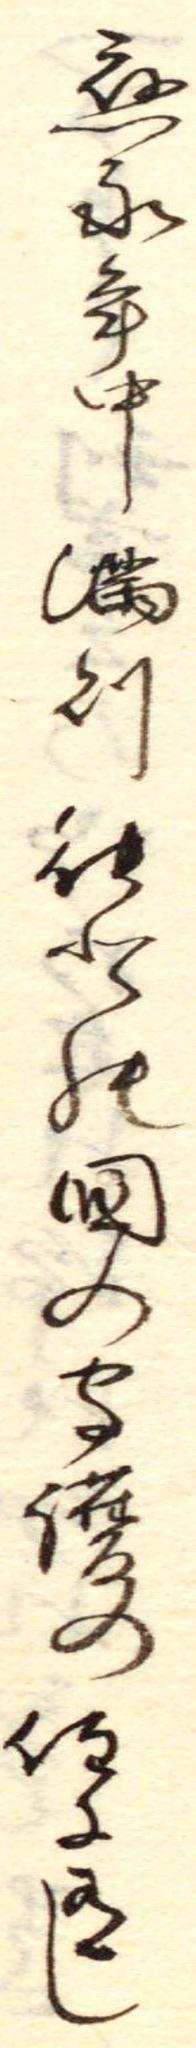応永年中満則能登の国の守護の任に有し
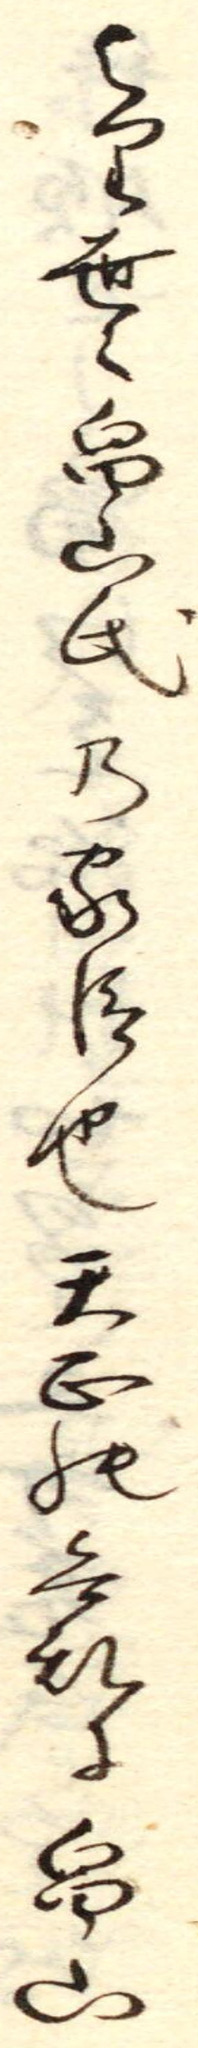より世々畠山氏の家臣也天正の兵乱に畠山
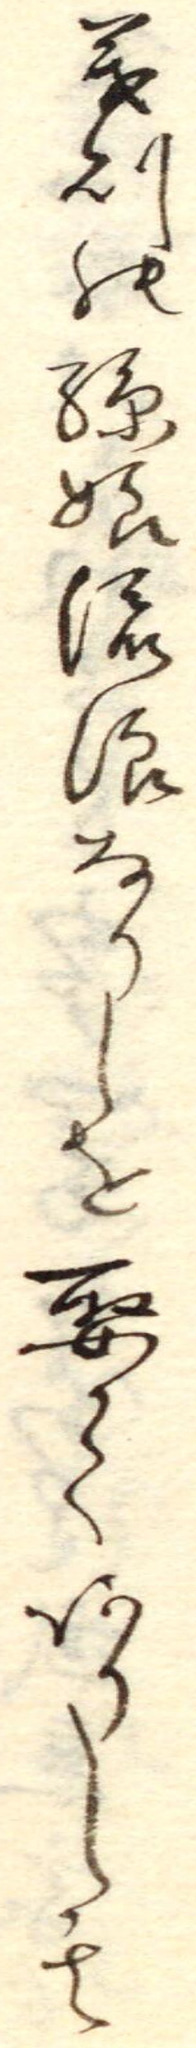義則の孫娘流浪なりしを娶てありしか其
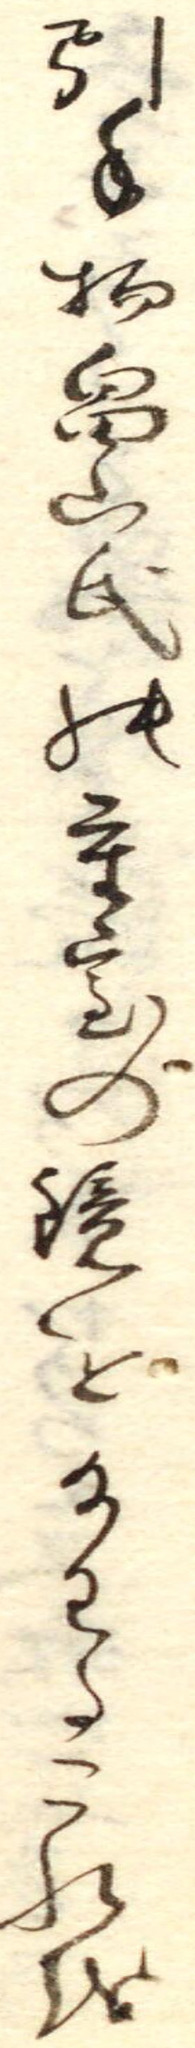引手物畠山氏の重宝の鏡を給わるこれを
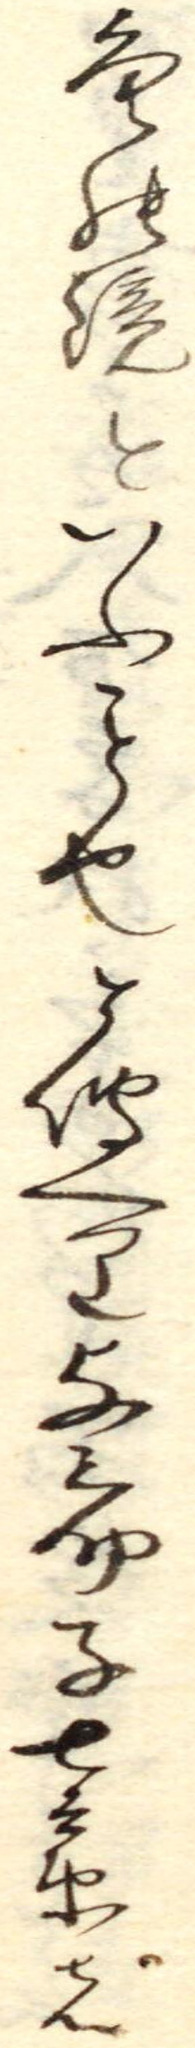唐の鏡といふこと也と伝へり与三助子七兵衛は
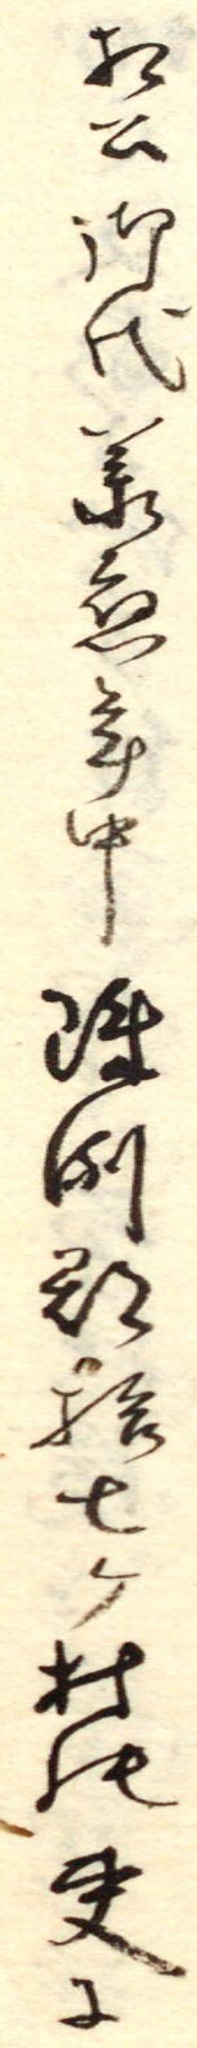相公御代承応年中珠洲拾七ヶ村の吏に
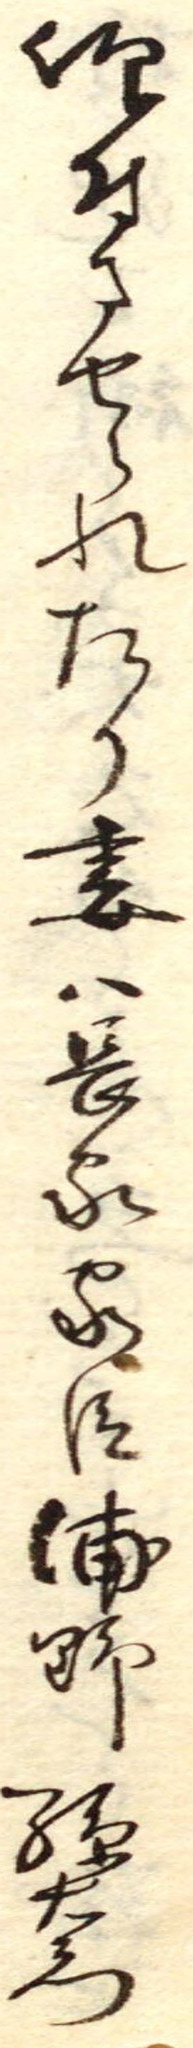仰付させられたり妻は長家家臣浦野孫右衛門
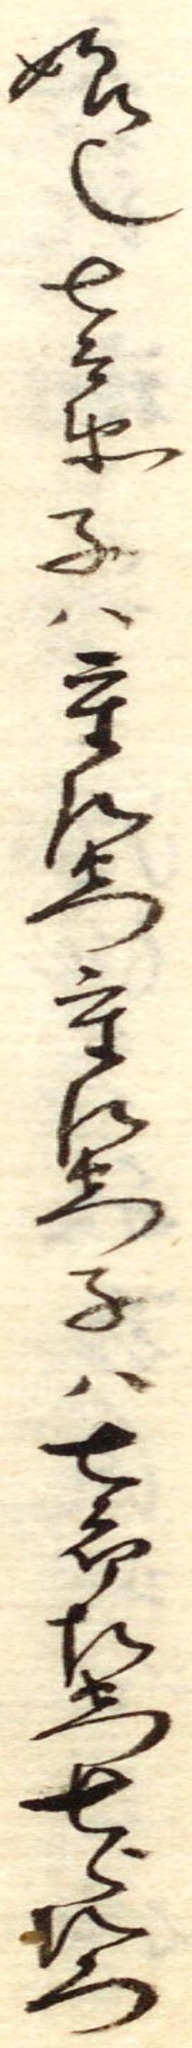娘也七兵衛子は重左衛門重左衛門子は七郎左衛門七郎左衛門
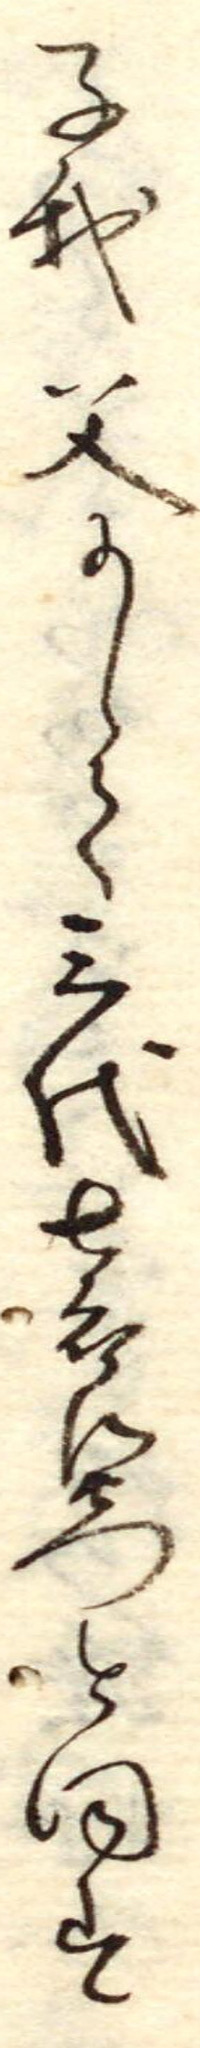子我父にして三代七郎左衛門と同す
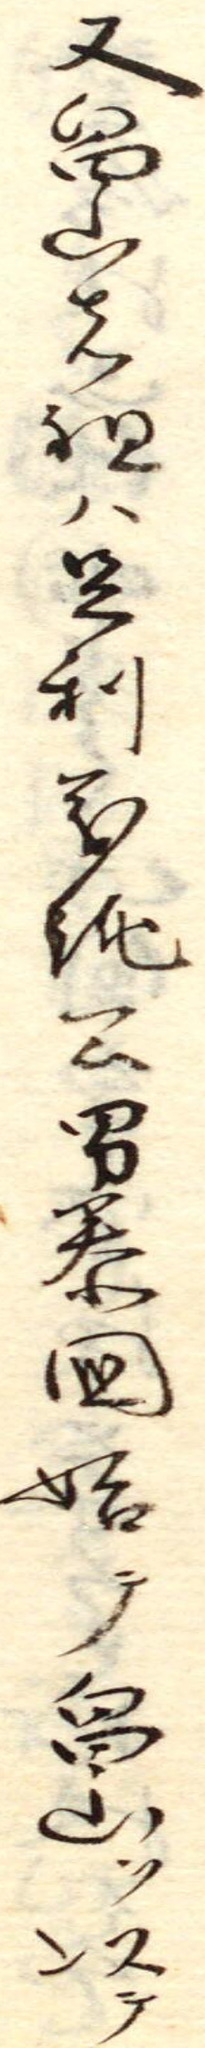又畠山先祖は足利義純公男泰国初て畠山以
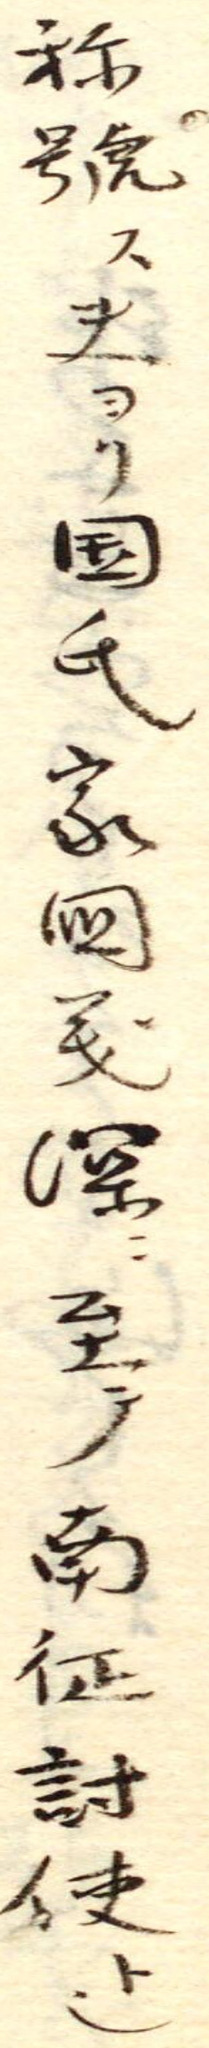称号夫より国氏家国義深至て南征討使也
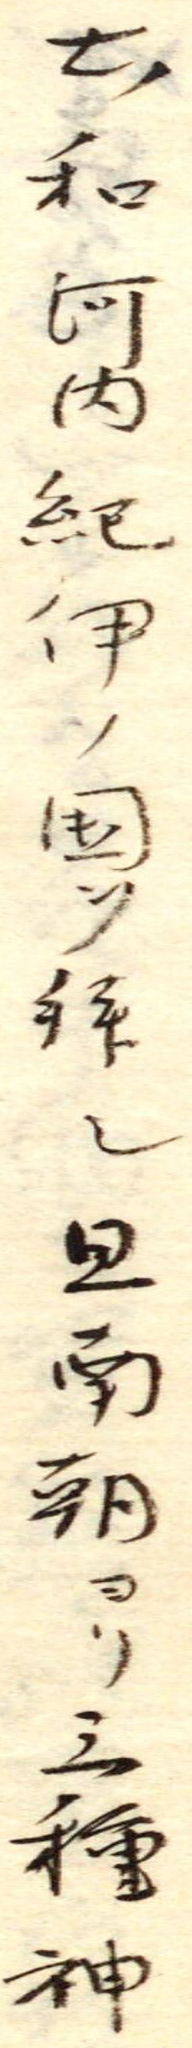大和河内紀伊ノ国拝し且南朝より三種神
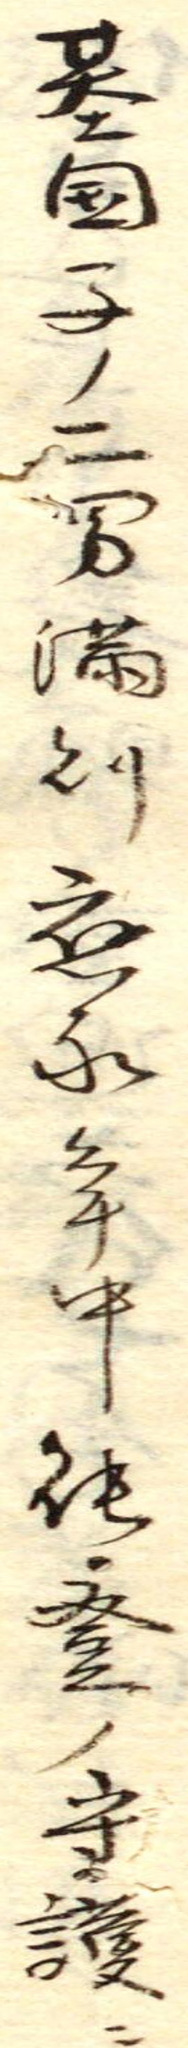基国子ノ二男満則応永年中能登ノ守護

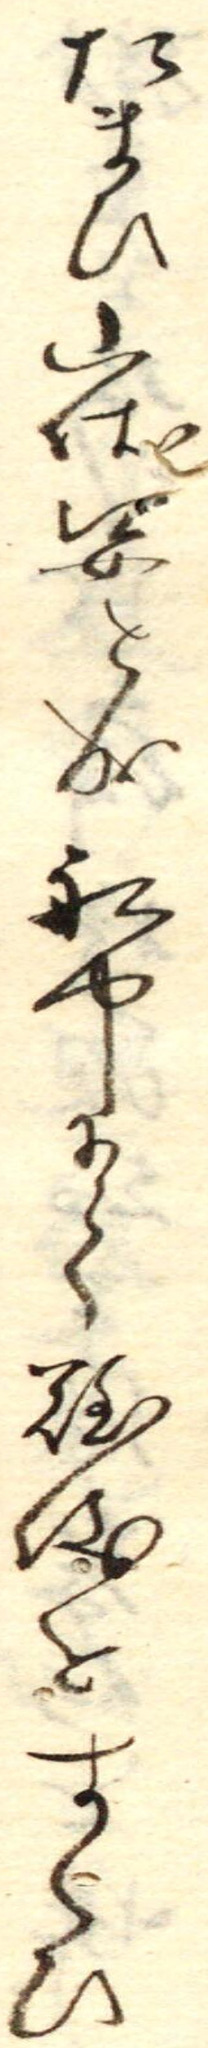たまひ山伏姿と成船中にて難儀をすくひ
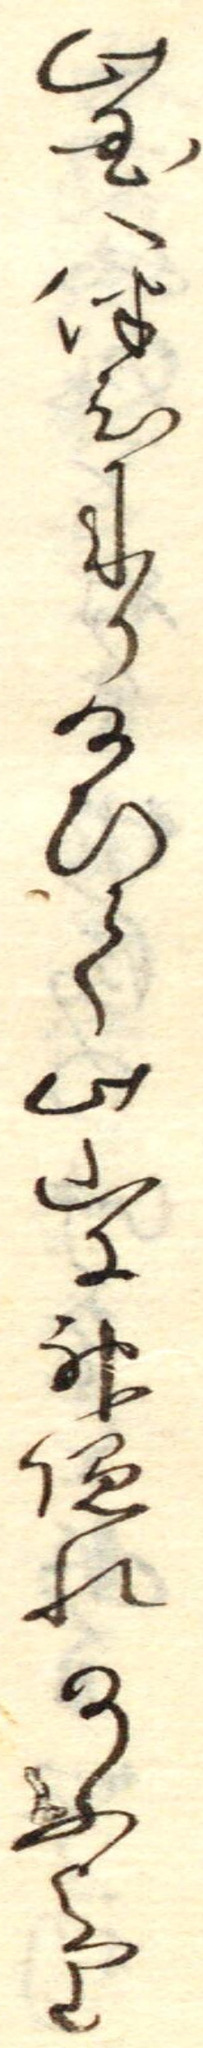此国へ伴ひ来り給ひて此山に神隠れ給ふより
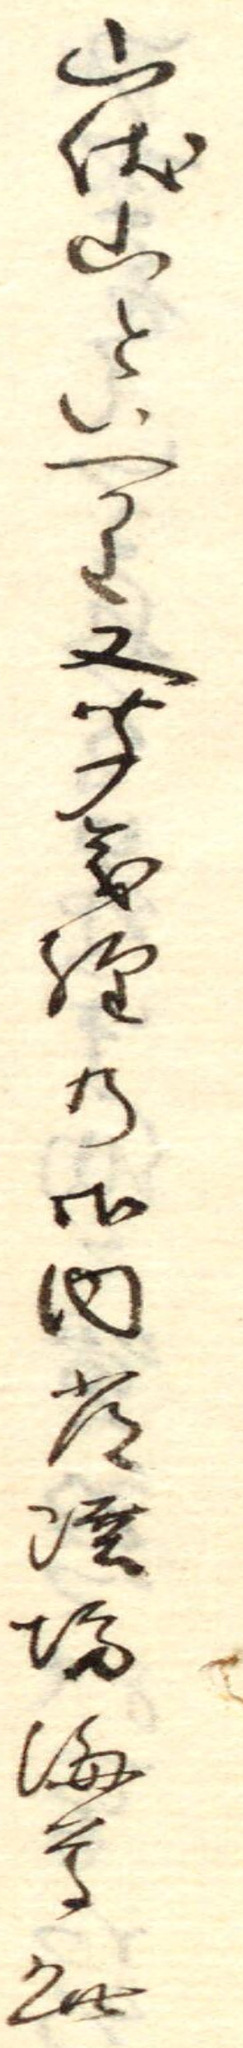山伏山といへり又聞義経の御内常陸坊海尊此
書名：能登名跡誌
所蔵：Ishikawa Prefectural Library
